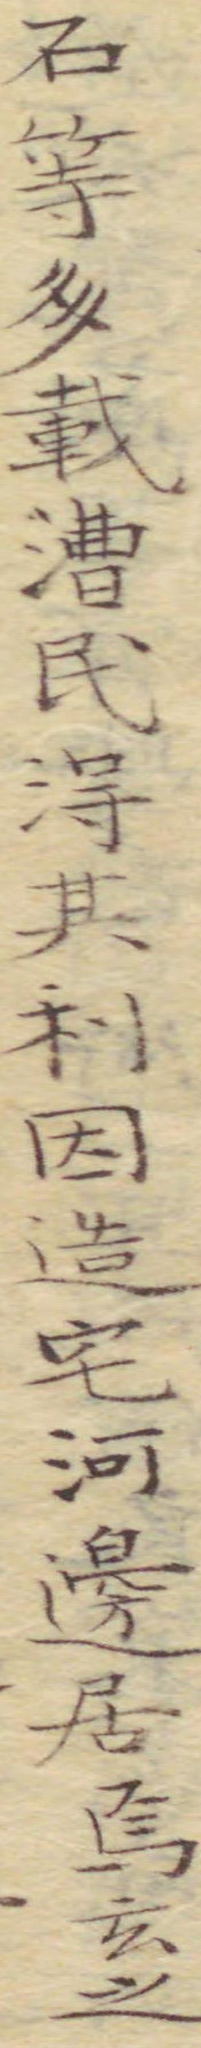石等多載漕民淂其利因造宅河辺居焉玄之
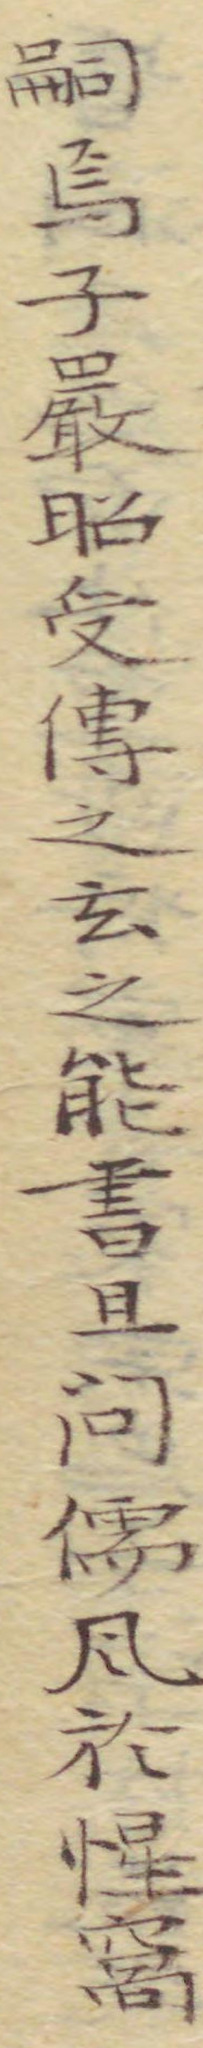嗣焉子厳昭受伝之玄之能書且問儒風於惺窩
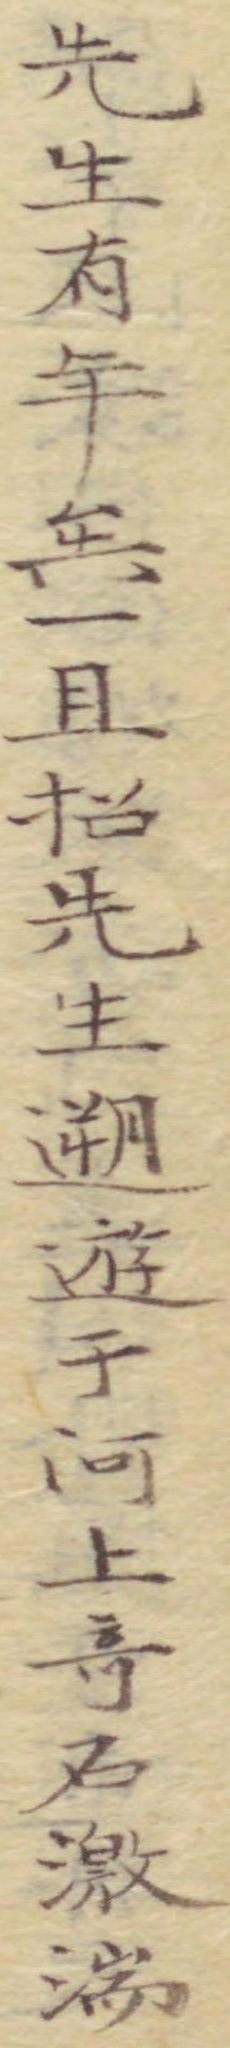先生有年矣一旦招先生遡遊于河上寄石激湍
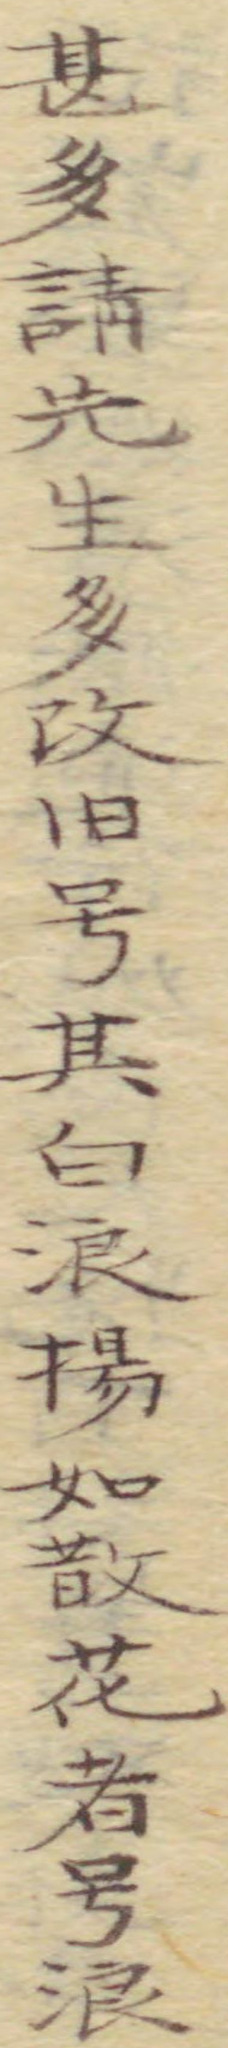甚多請先生多改旧号其白浪揚如散花者号浪
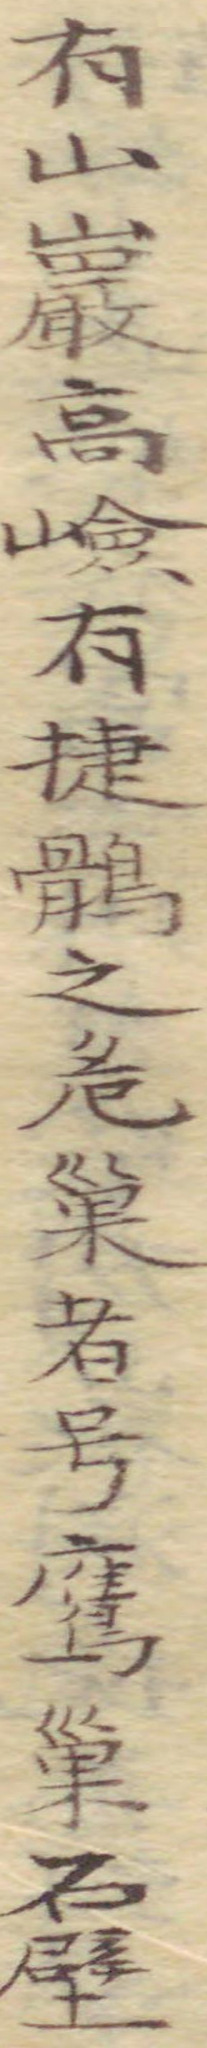有山巌高嶮有捷鶻之危巣者号鷹巣石壁
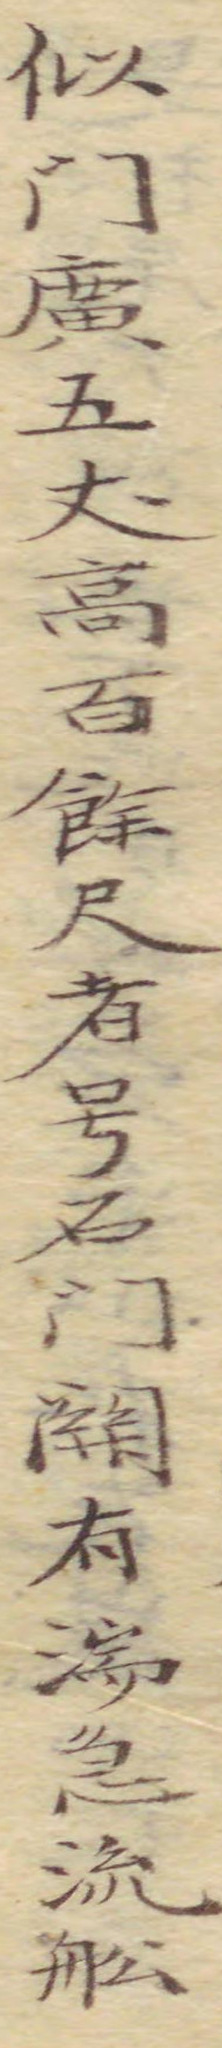似門広五丈高百余尺者号石門関有湍急流船
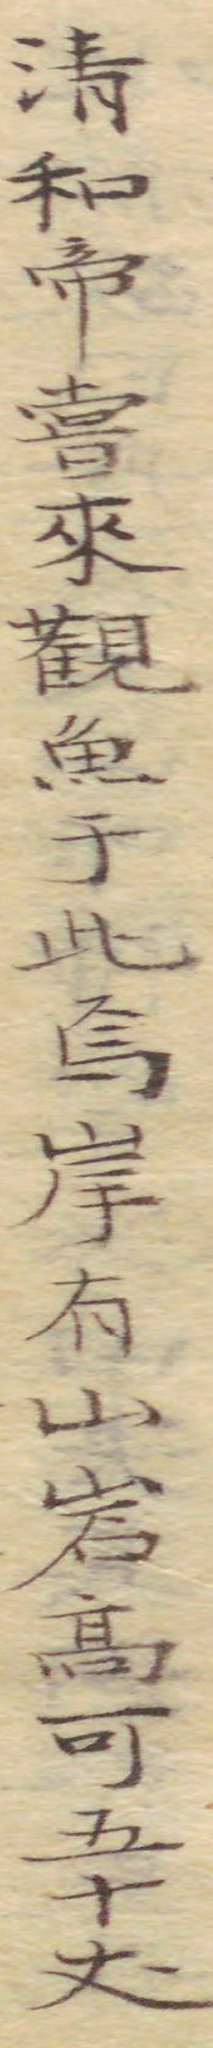清和帝嘗来観魚于此焉岸有山岩高可五十丈
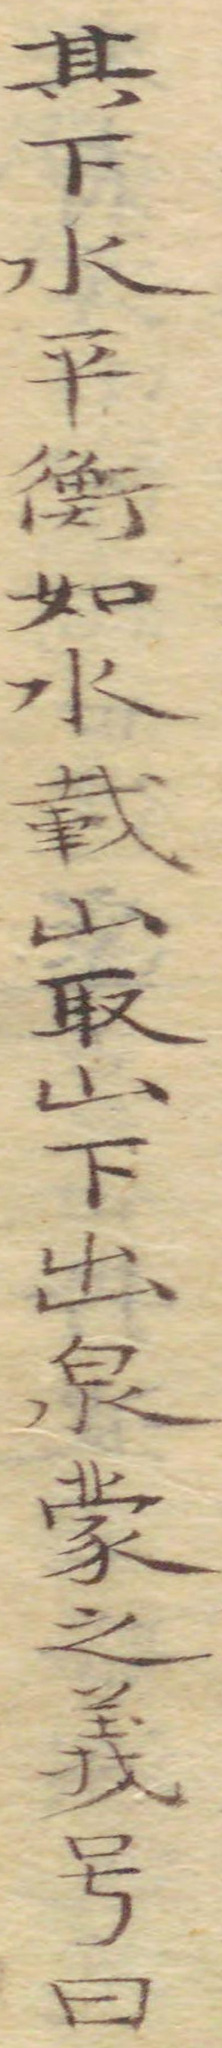其下水平衡如水載山取山下出泉蒙之義号曰
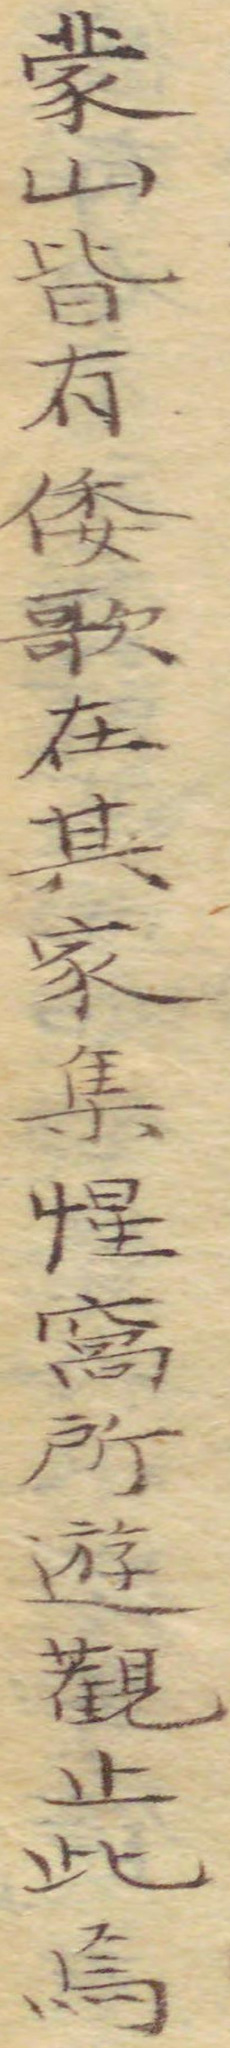蒙山皆有倭歌在其家集惺窩所遊観止此焉

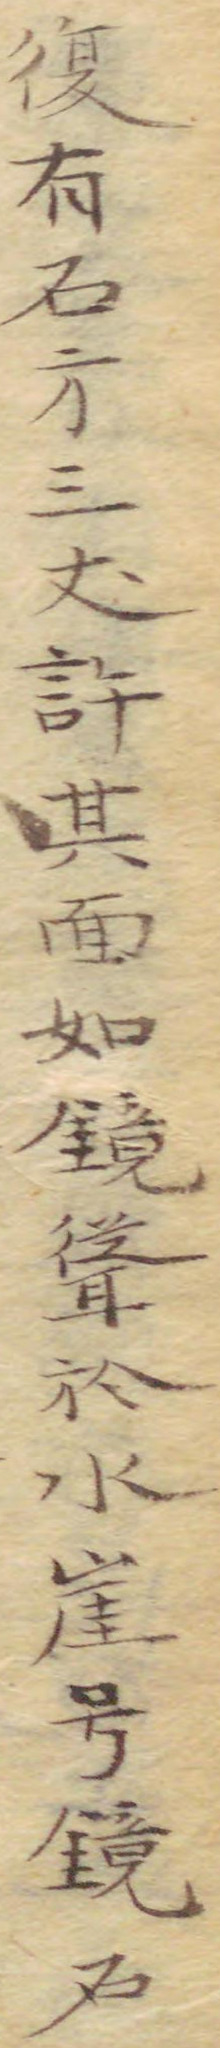復有石方三丈許其面如鏡聳於水崖号鏡石
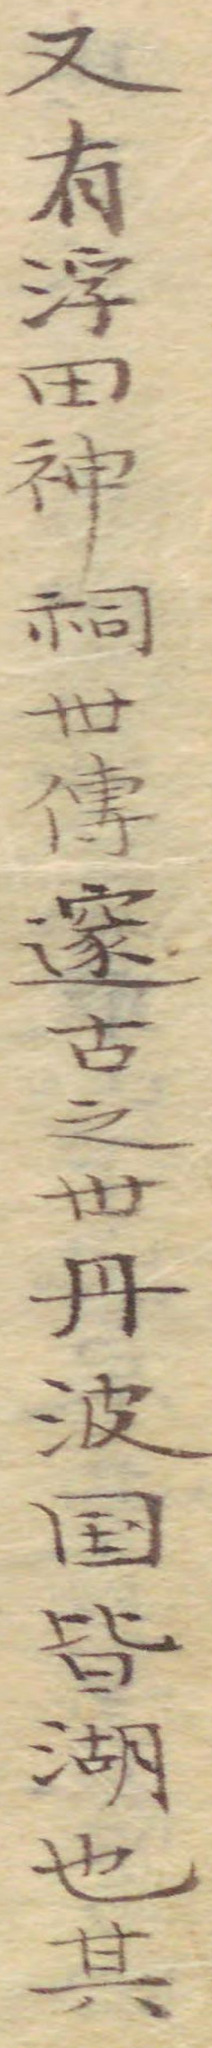又有浮田神祠世伝邃古之世丹波国皆湖也其
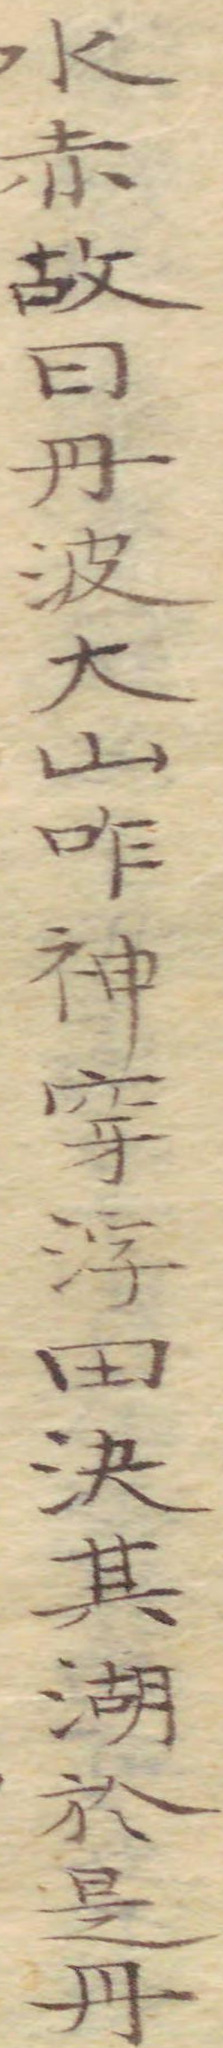水赤故曰丹波大山咋神穿浮田決其湖於是丹
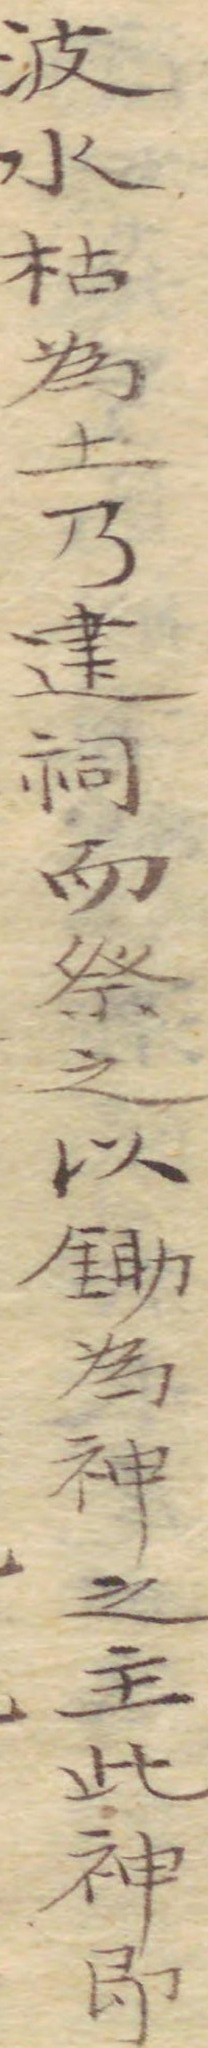波水枯為土乃建洞而祭之以鋤為神之主此神即
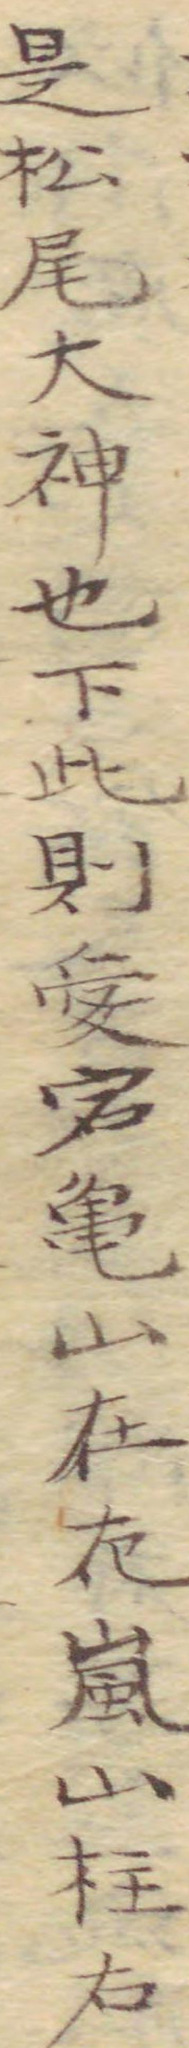是松尾大神也下此則愛宕亀山在左嵐山柱右
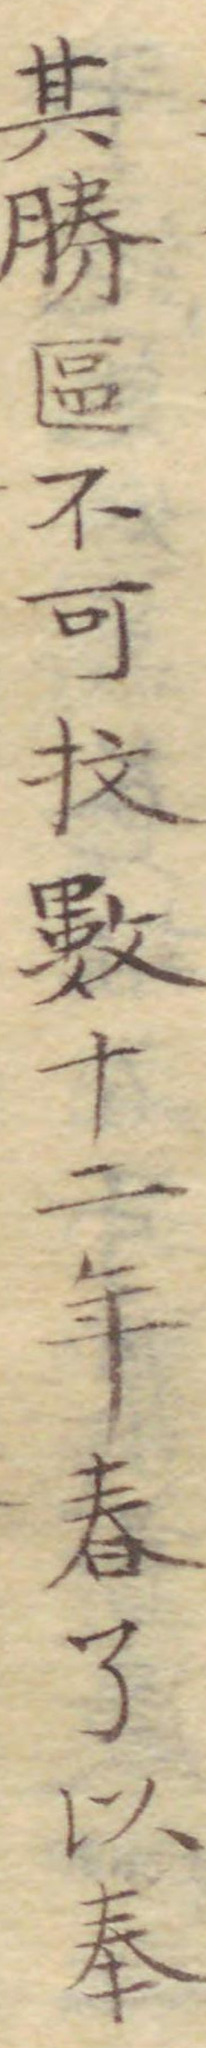其勝区不可抆数十二年春了以奉
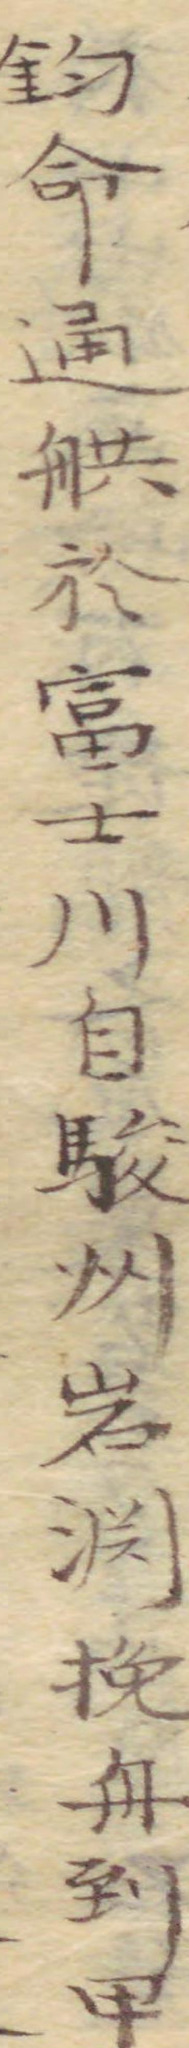鈞命通舼於富士川自駿州岩渕挽舟到甲
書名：鶯宿雑記. 巻263-264
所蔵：国立国会図書館 National Diet Library, JAPAN
